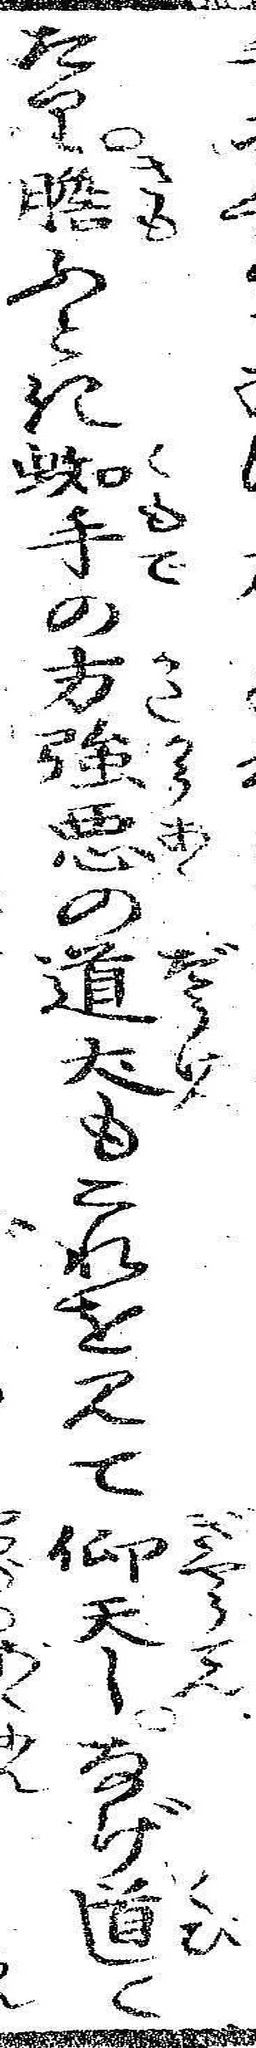たり。胆ふとき蜘手の方強悪の道犬もこれを見て仰天し。なげ首して
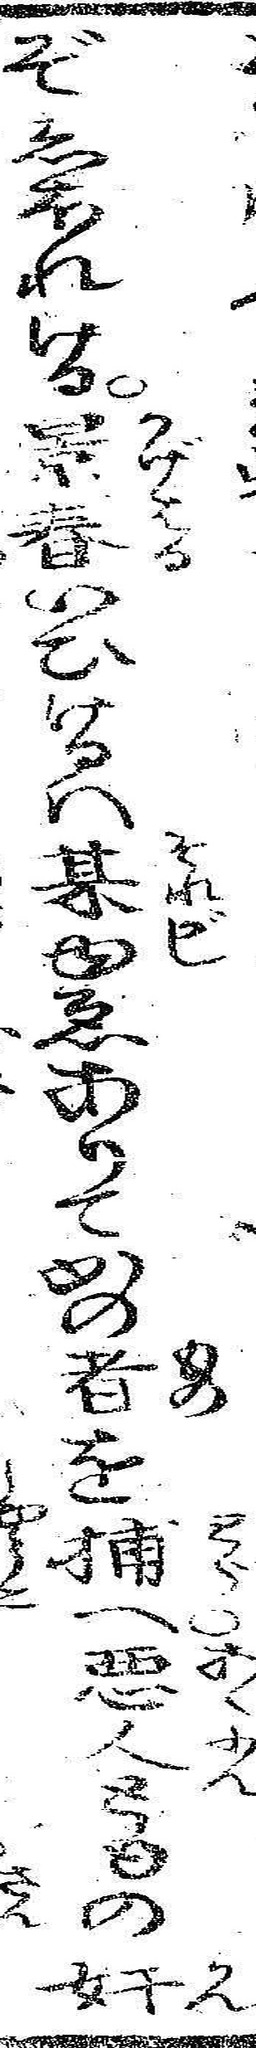ぞしほれける。景春のいひけるは某ゆゑありてかの者を捕へ。悪人ともの奸
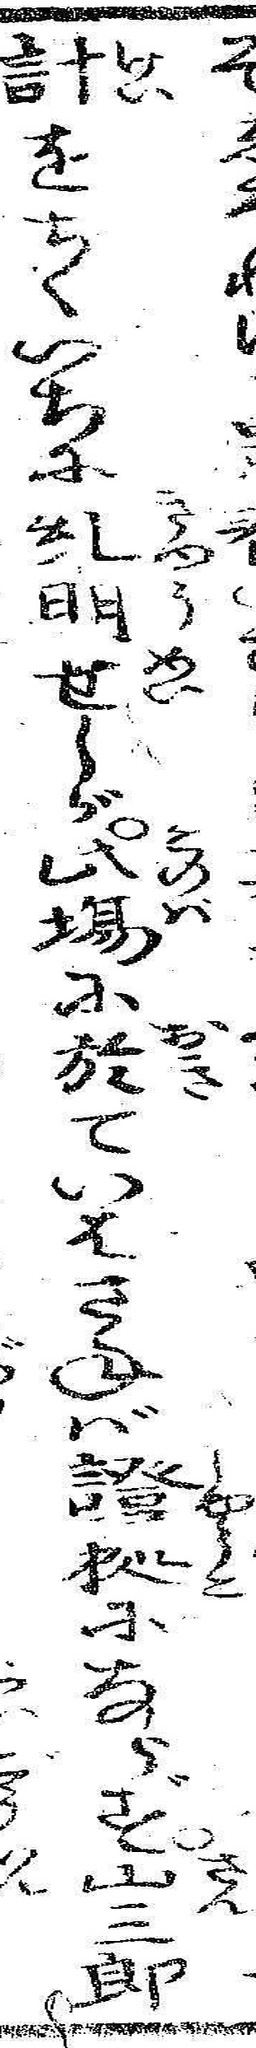計をちくいちに糺明せしが。此場に於ていはさねば証拠にならず。山三郎
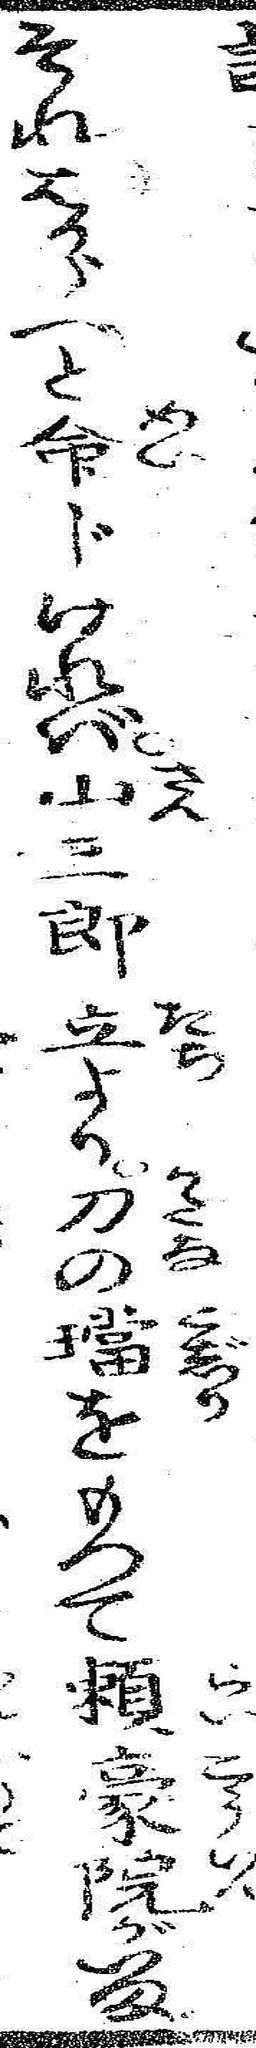それはからへと命じければ。山三郎立より。刀の璫をもつて頼豪院がいま
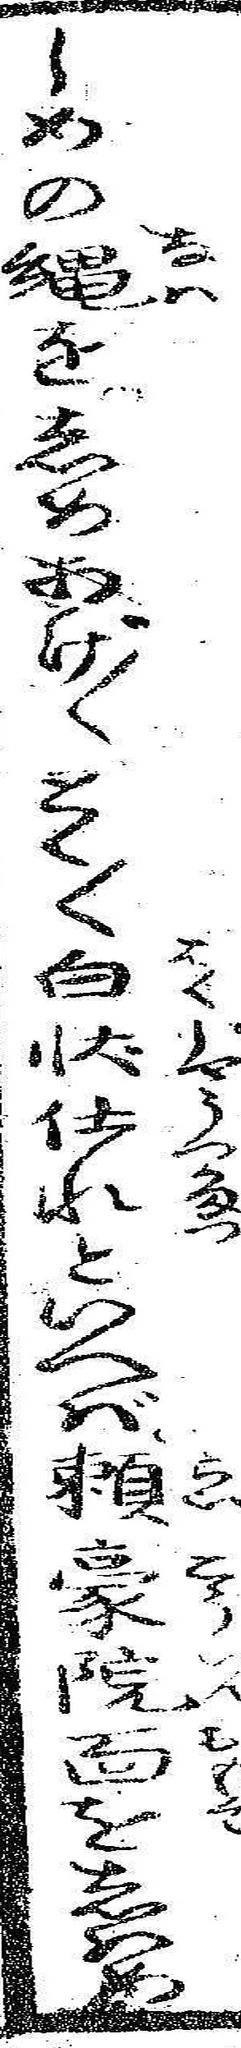しめの縄を。しめあげ〳〵とく〳〵白状仕れといへば。頼豪院面をしはめ
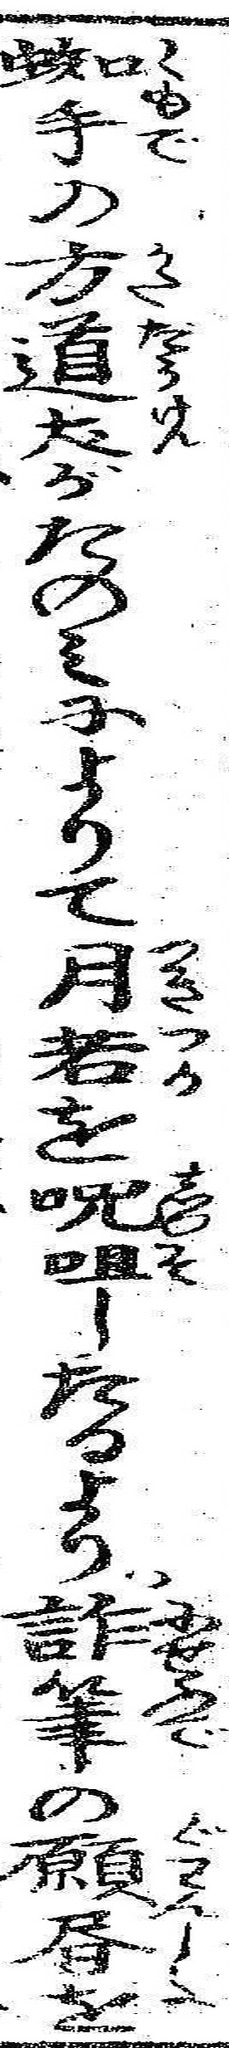蜘手の方道犬がたのみによりて月若を呪咀したるより。詐筆の願書を
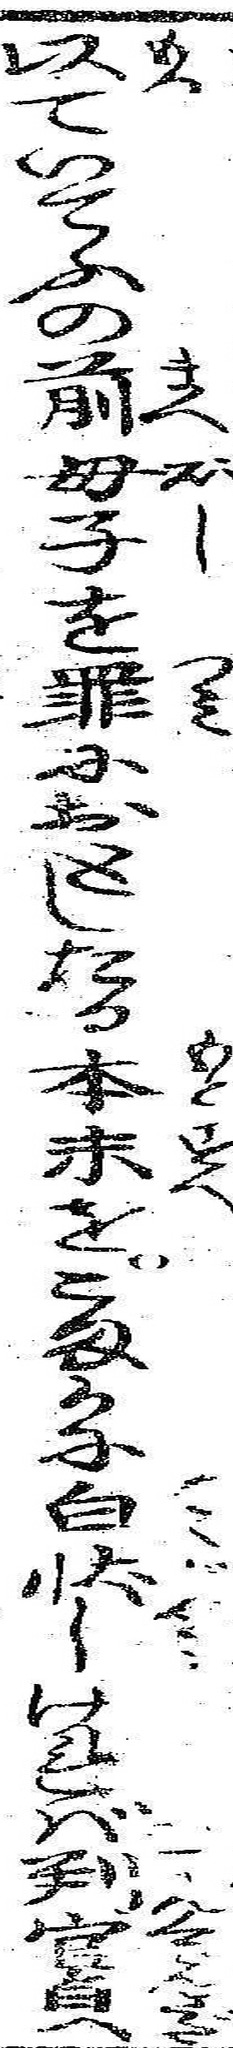以ていてふの前母子を罪におとしたる本末を。こまかに白状しければ。判官貞
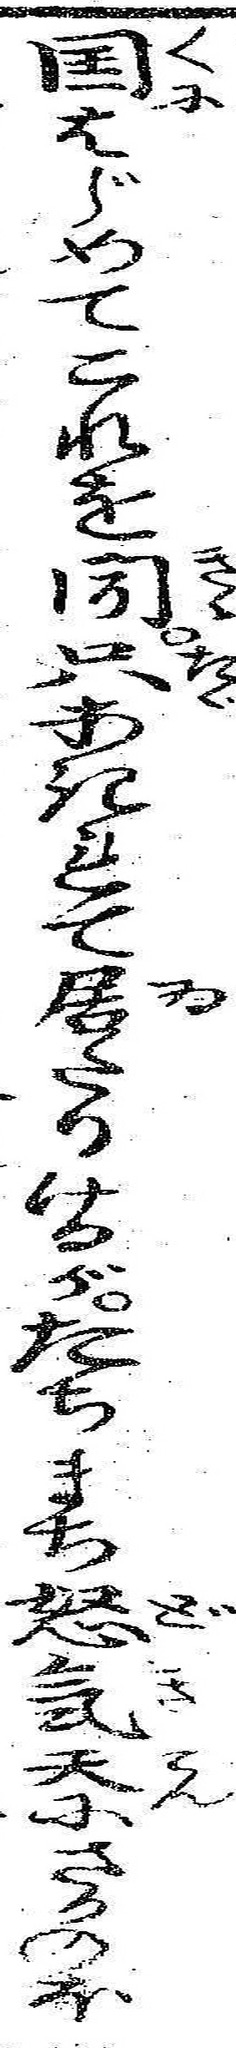国はじめてこれを聞。只あきれて居たりけるが。たちまち怒気天にさかのほ
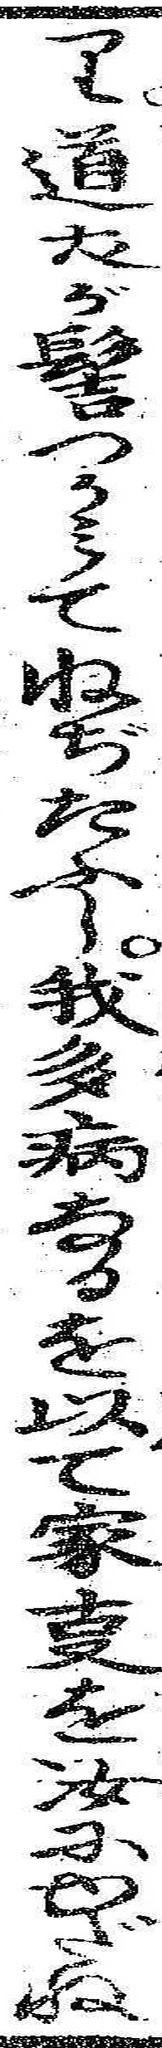り。道犬が髻つかみてねぢたふし。我多病なるを以て家事を汝にゆだね
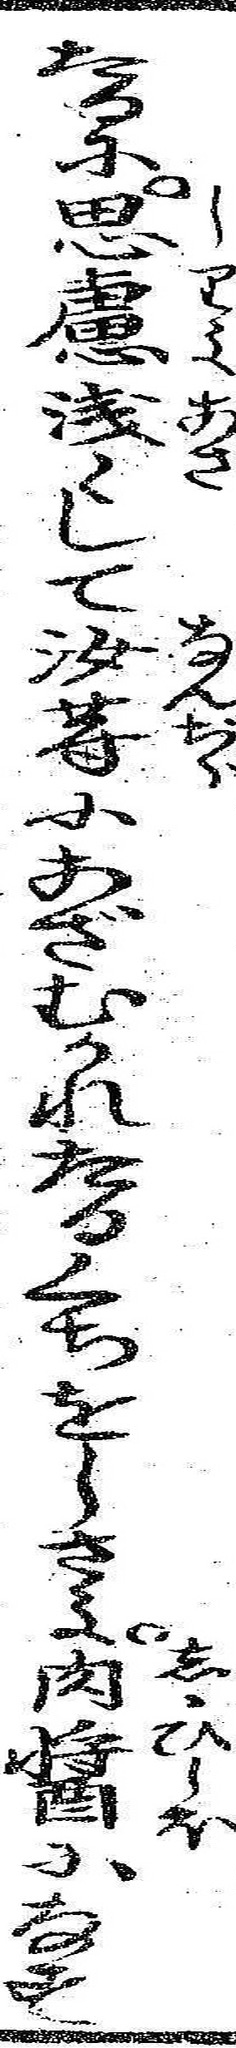たるに。思慮浅くして汝等にあざむかれたるくちをしさよ。肉醤になす
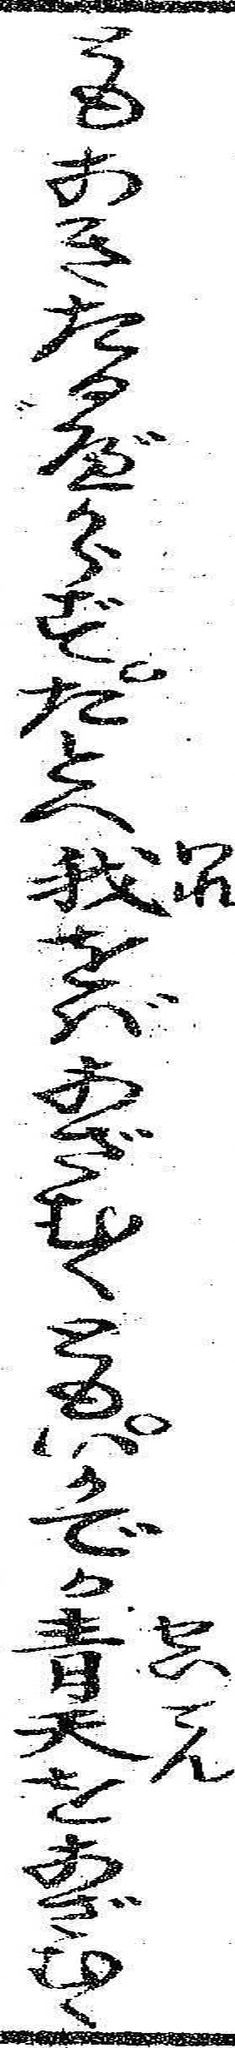ともあきたるべからず。たとへ我をばあざむくとも。いかでか青天をあざむく
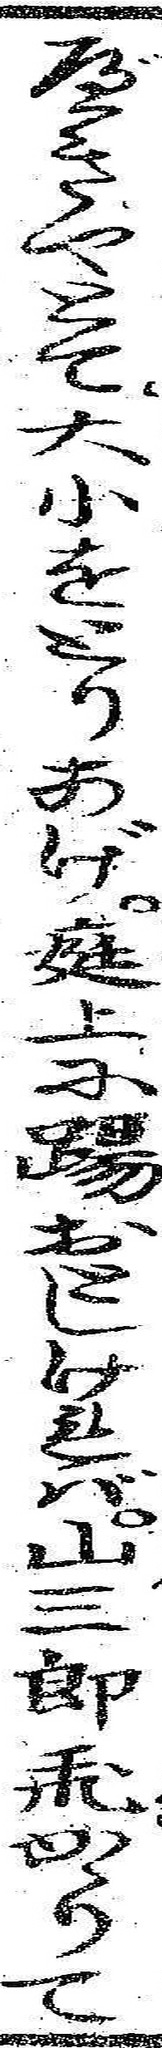べきやとて。大小をとりあげ。庭上に踢おとしければ。山三郎飛かゝりて
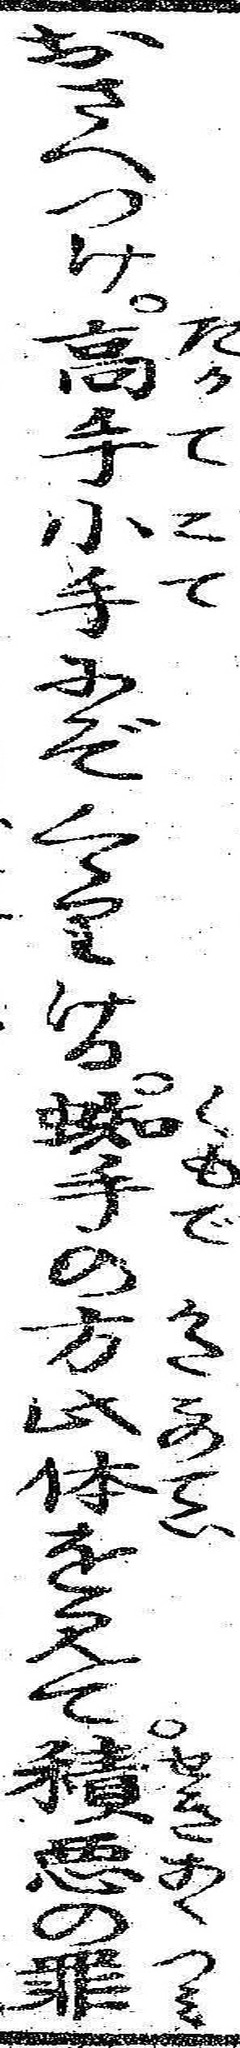おさへつけ。高手小手にぞくゝりける。蜘手の方此体を見て。積悪の罪
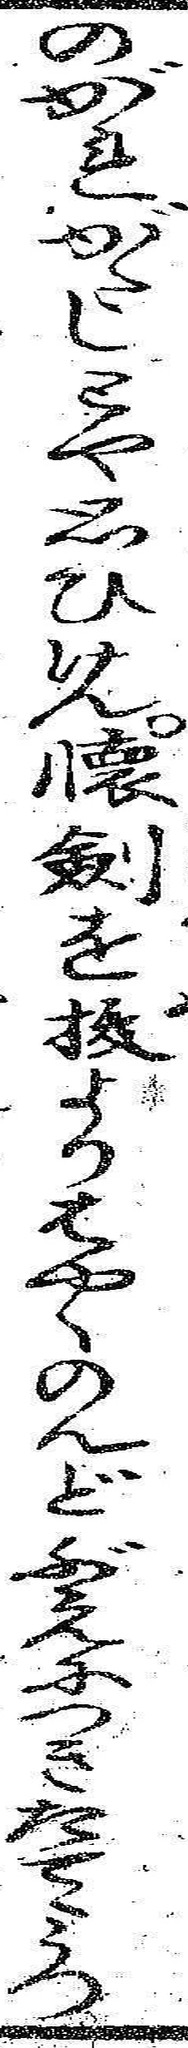のがれがたしとや思ひけん。懐剣を抜よりはやくのんどぶえにつきたてゝうつ
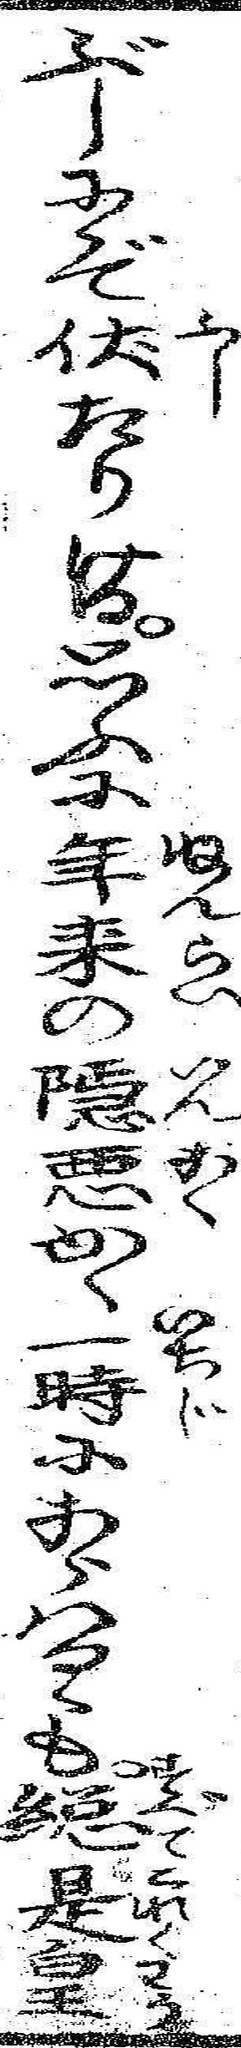ぶしにぞ伏たりける。思ふに年来の隠悪かく一時にあらはるゝも。総是皇
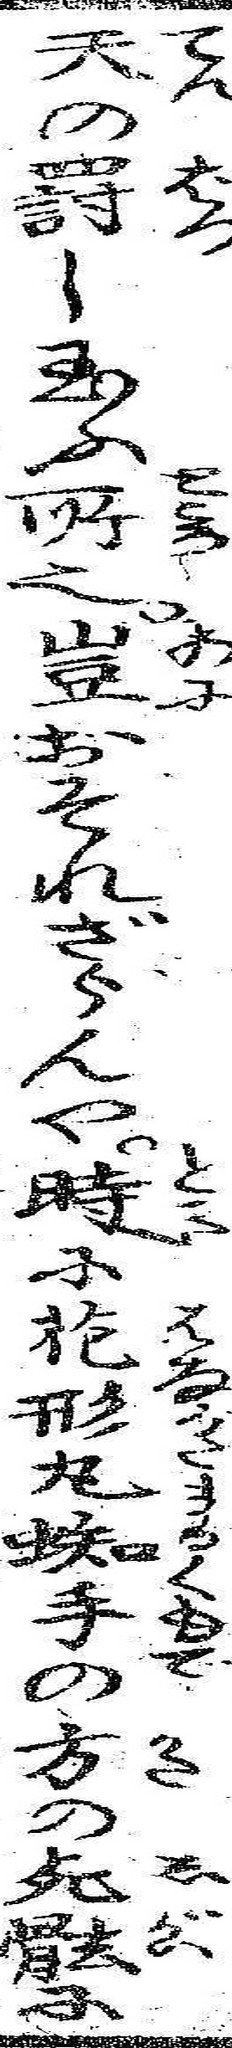天の罰し玉ふ所也。豈おそれざらんや。時に花形丸蜘手の方の死骸に
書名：昔話稲妻表紙
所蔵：国文学研究資料館
